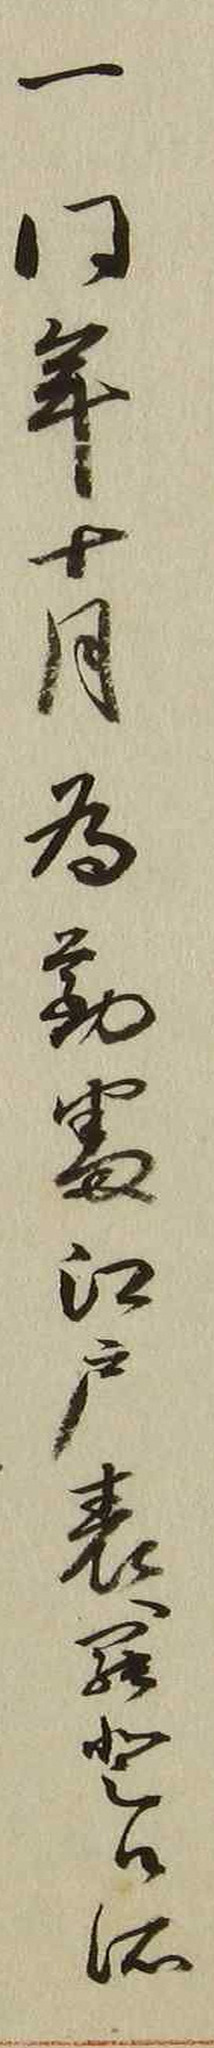一同年十月為勤番江戸表へ罷登候所
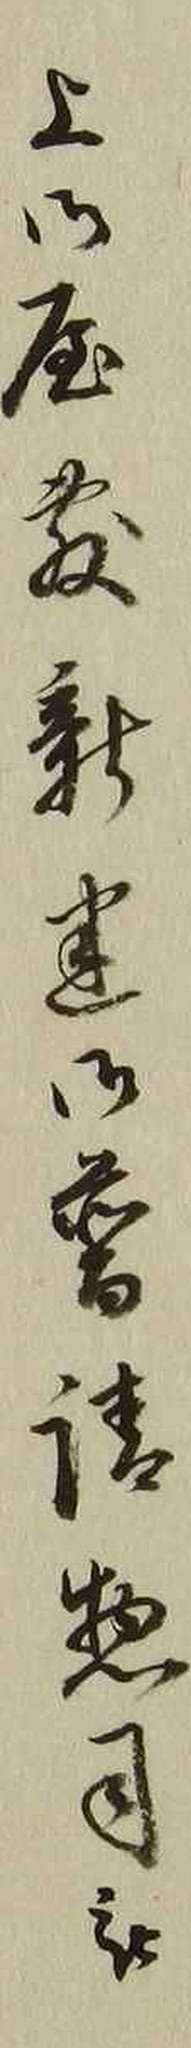上御屋敷新建御普請惣司被
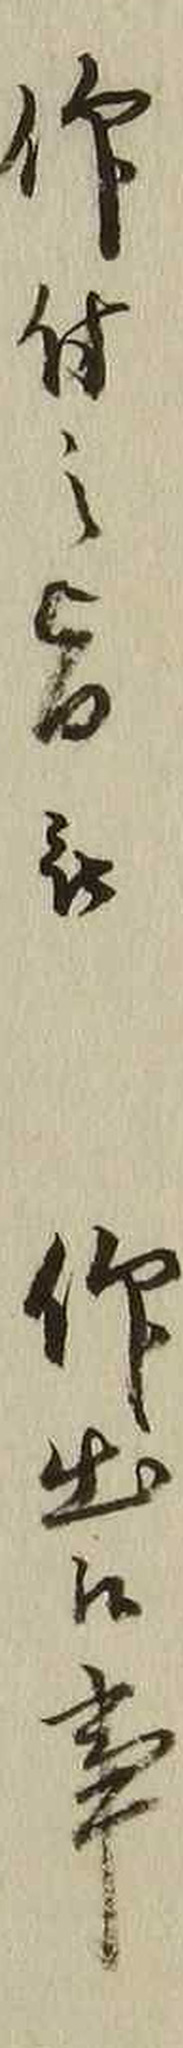仰付之旨被仰出候事
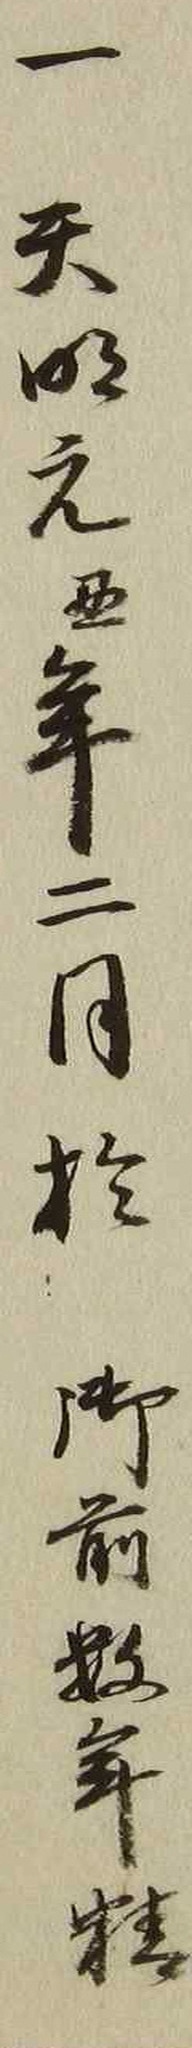一天明元丑年二月於御前数年精
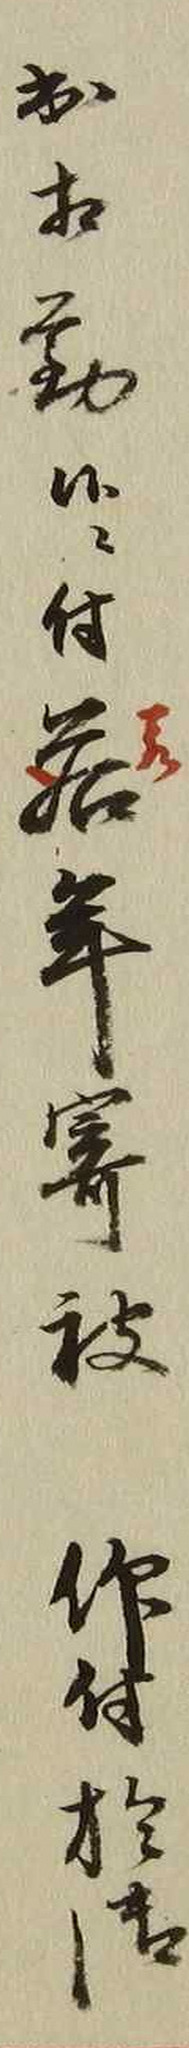出相勤候に付若年寄被仰付於御
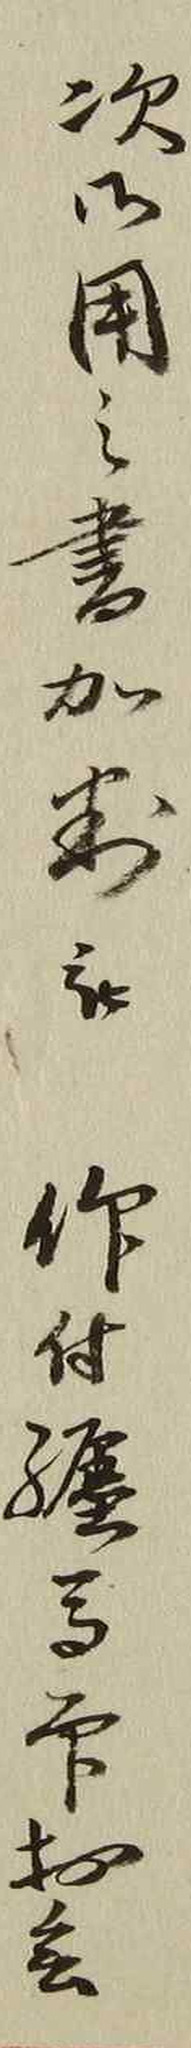次御用之書加判被仰付纏馬印会
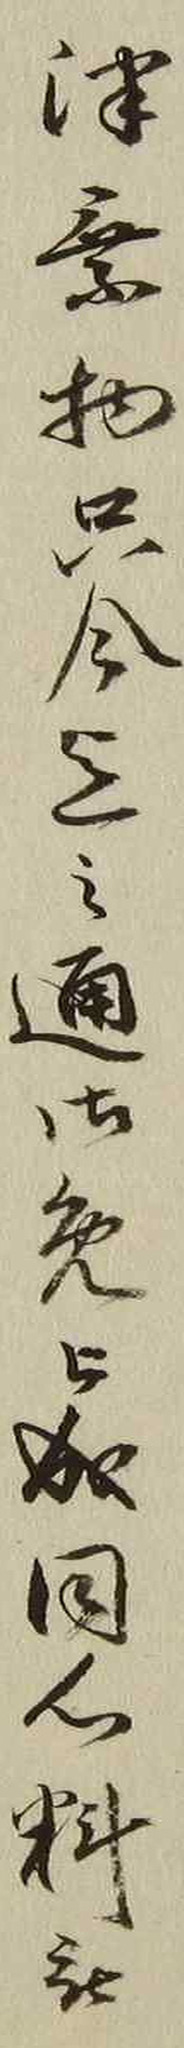津乗物只今迄之通御免被成同心料被
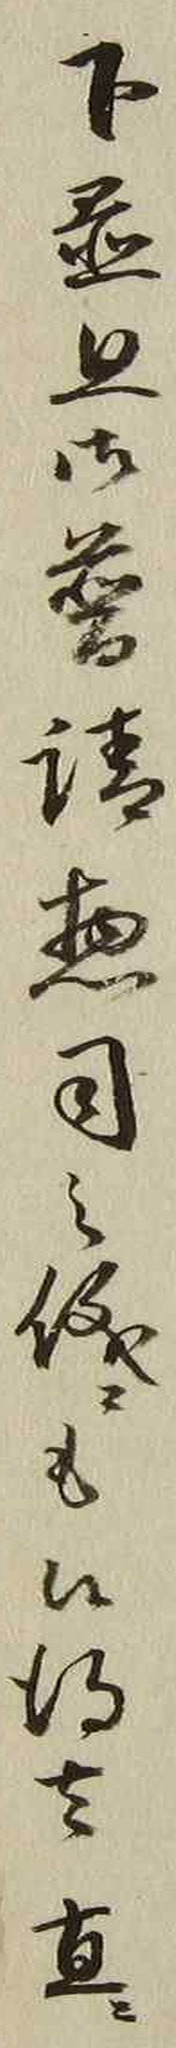下置且御普請惣司之儀にも候得は直々
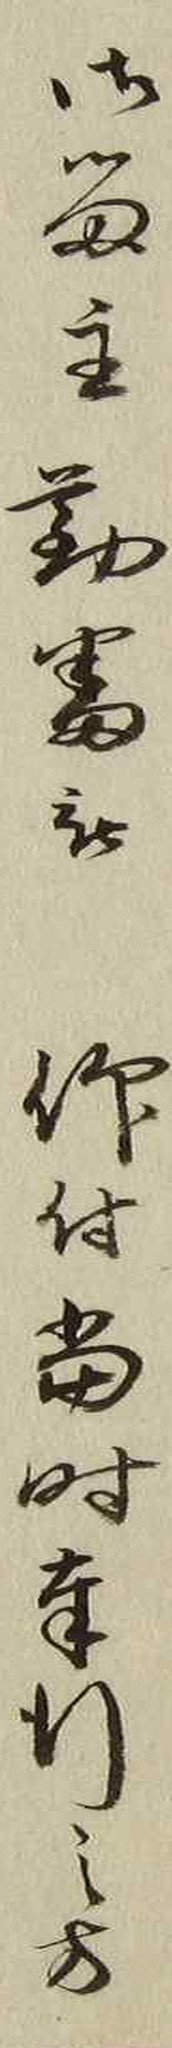御留守勤番被仰付当時奉行之方
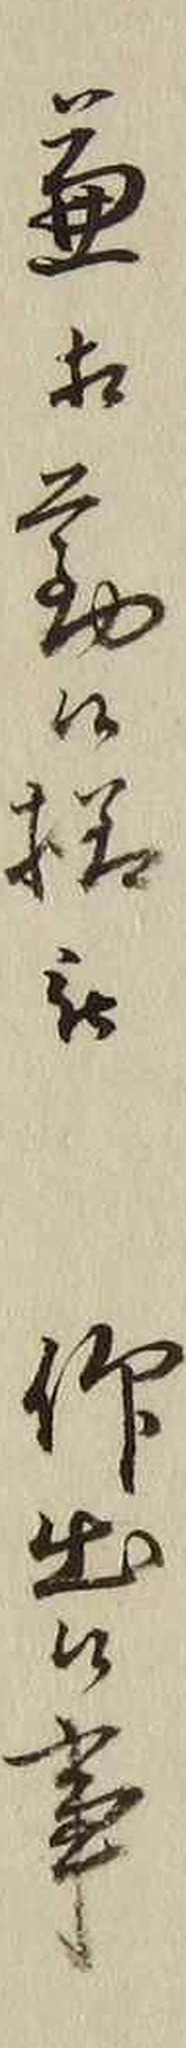兼相勤候様被仰出候事
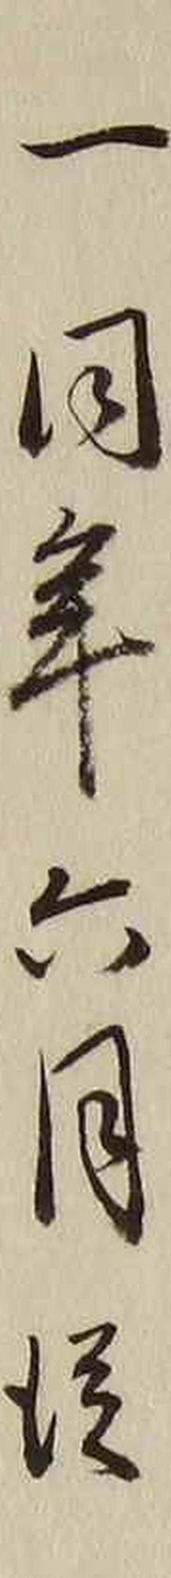一同年六月従
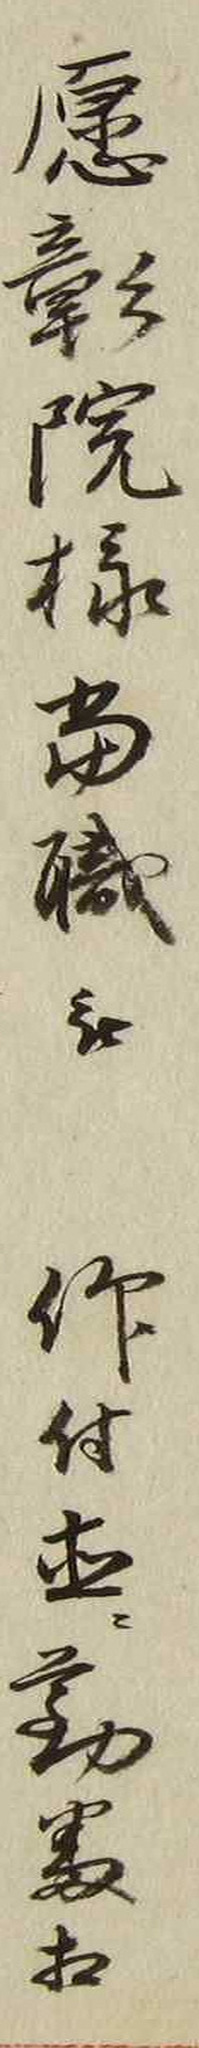愿彰院様当職被仰付直々勤番相
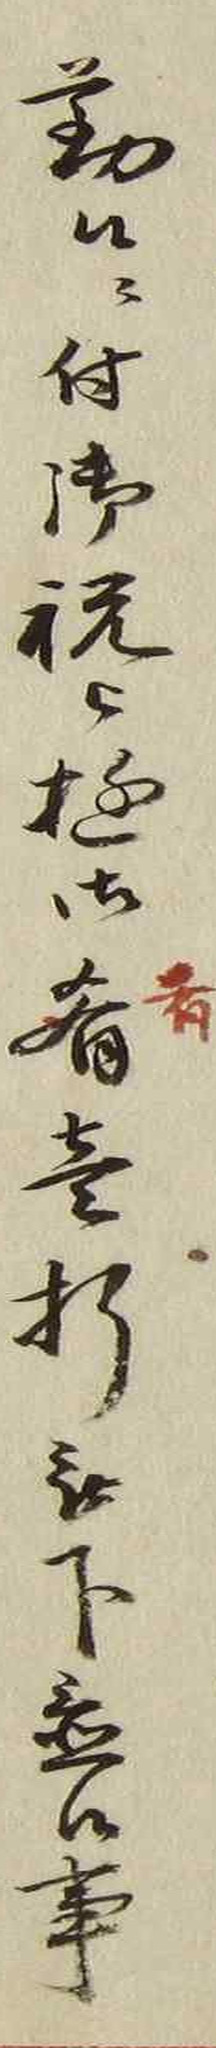勤候に付御祝被遊御肴壱折被下置候事
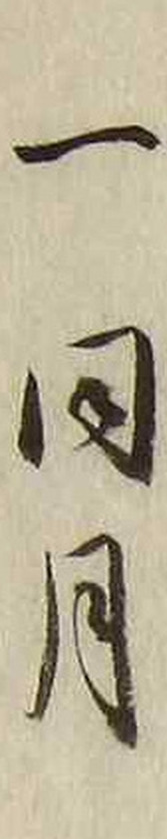一同月
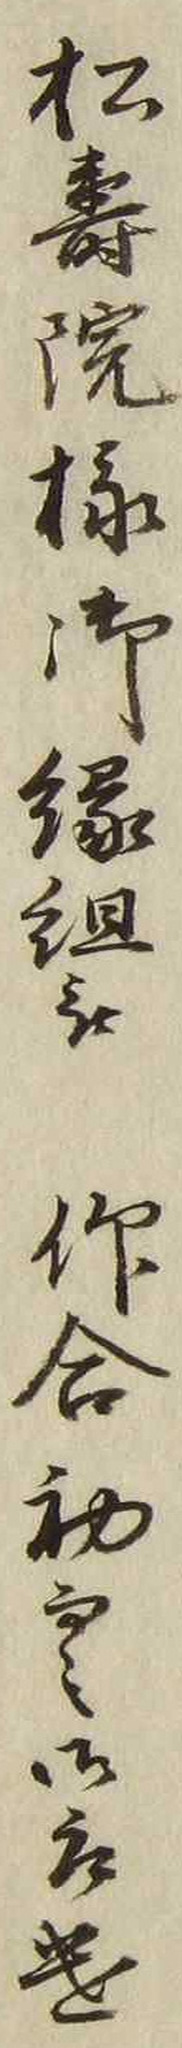松寿院様御縁組被仰合初而之御取遣

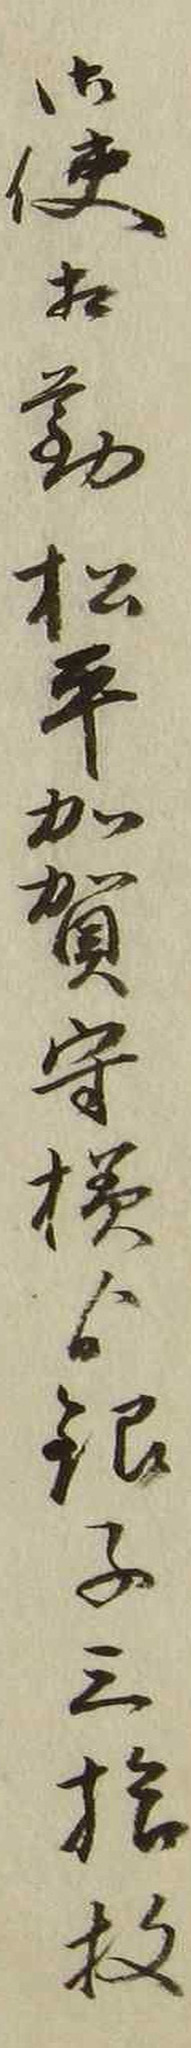御使相勤松平加賀守様ゟ銀子三拾枚
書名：諸士系譜　巻之125　た之部1
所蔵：会津若松市立会津図書館
